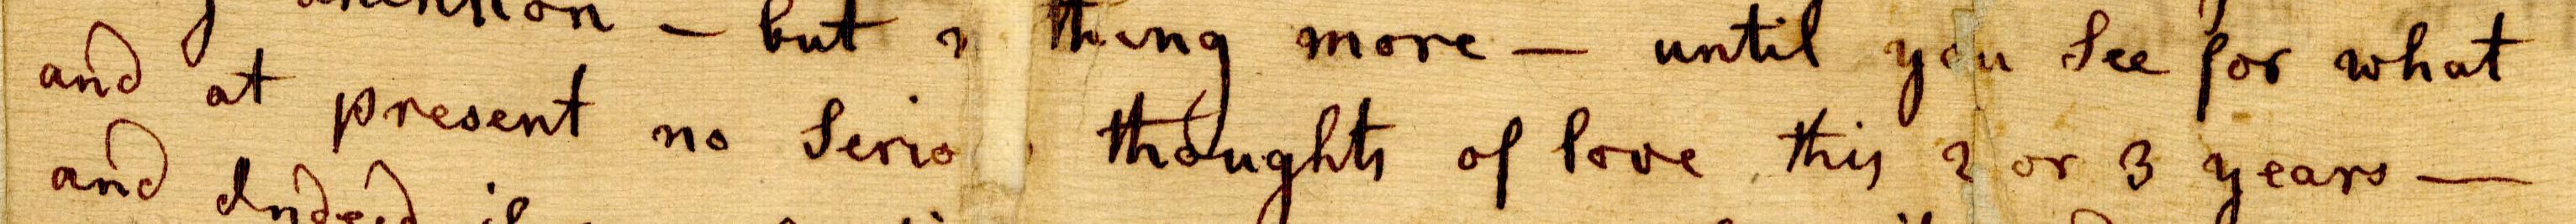and at present no serio[_] thoughts of love this 2 or 3 years-
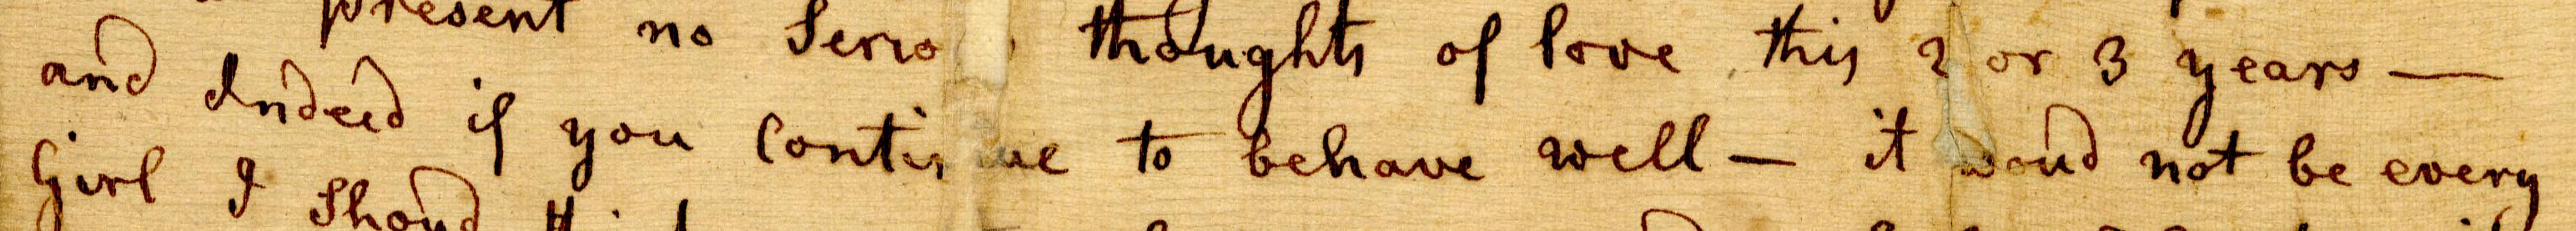and Indeed if you conti[_]ue to behave well- it woud not be every
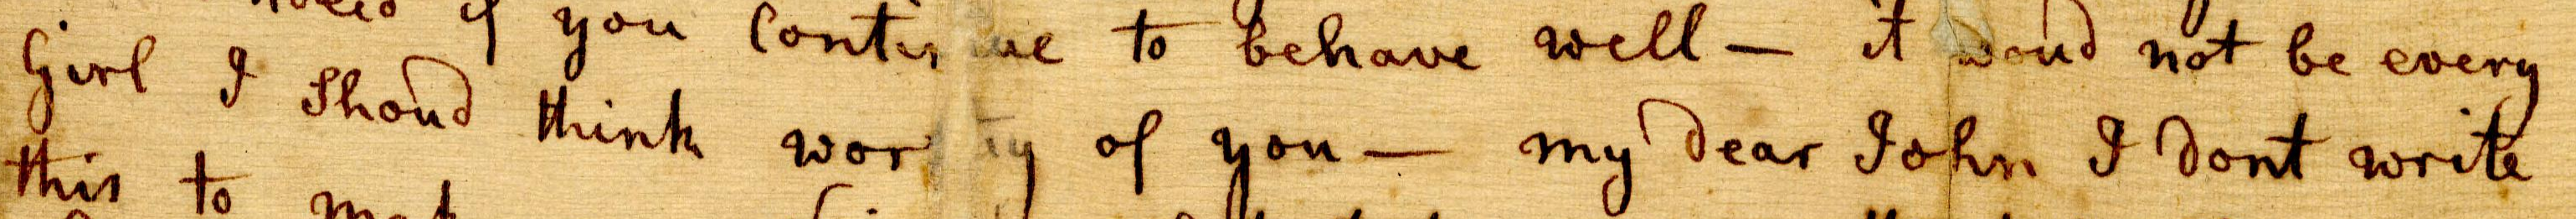Girl I shoud think wor[__]y of you- my dear John I dont write
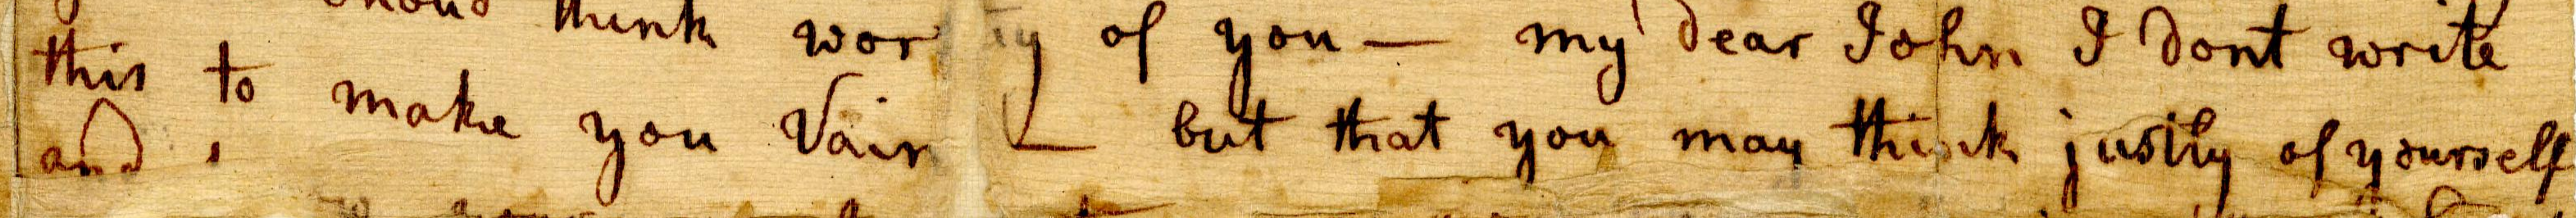this to make you Vain- but that you may think justly of yourself
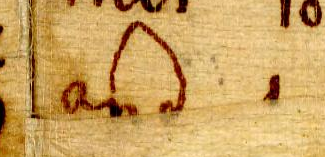and
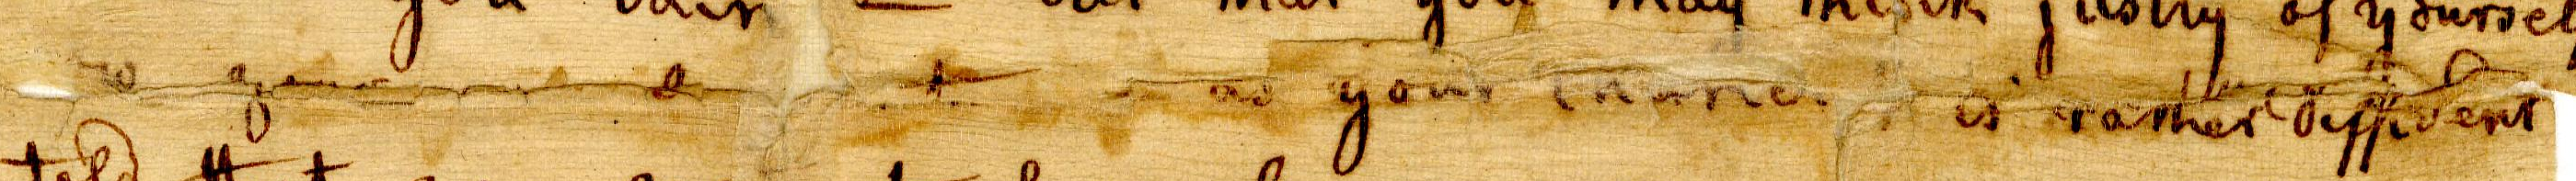[__] [____] [_] [_] [_] as your [_____] is rather different
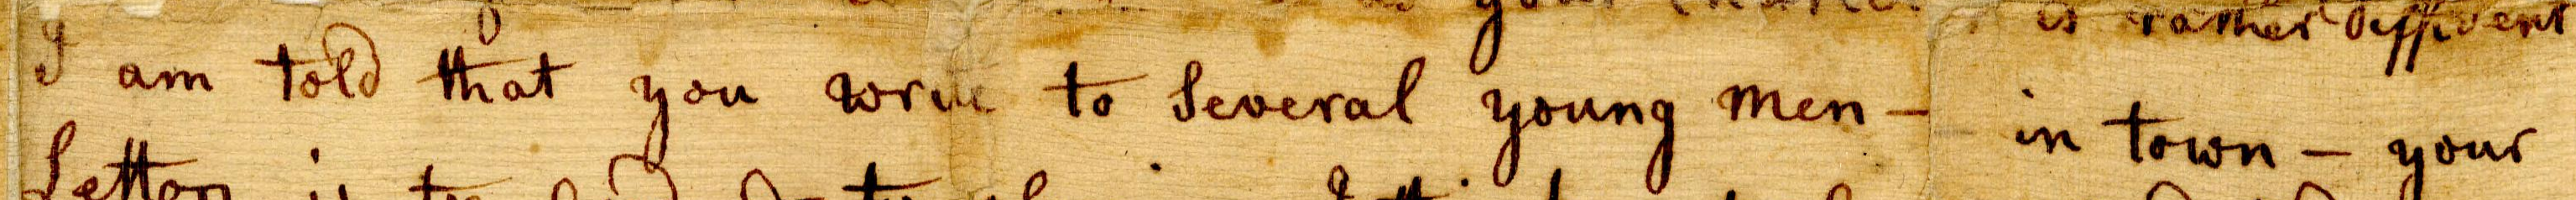I am told that you write to several your men- in town- your
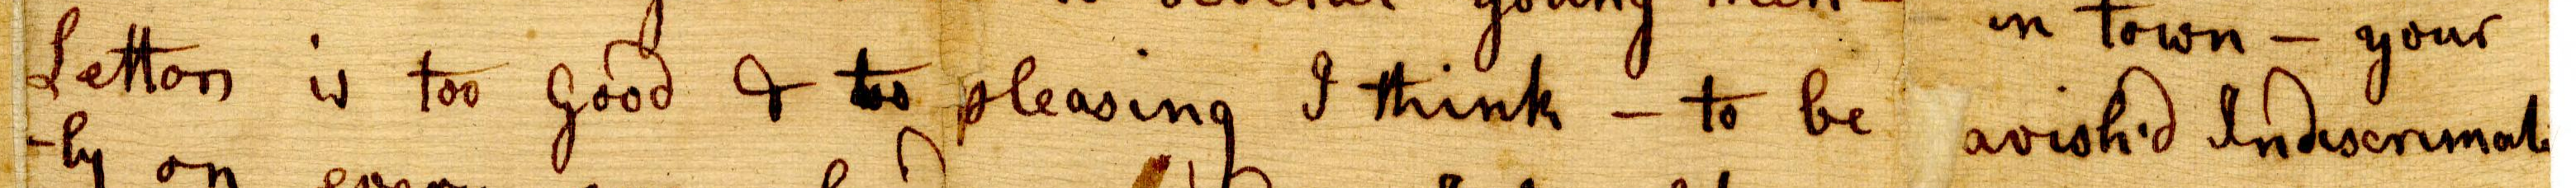Letter is too good & too pleasing I think- to be [_] avish'd Indiscrimate
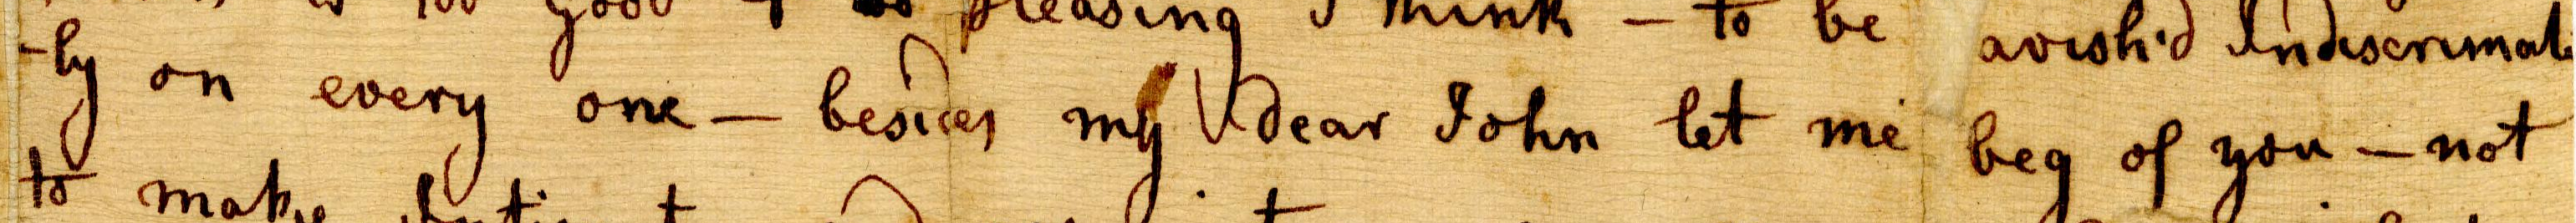-ly on every one- besides my dear John let me beg of you- not
